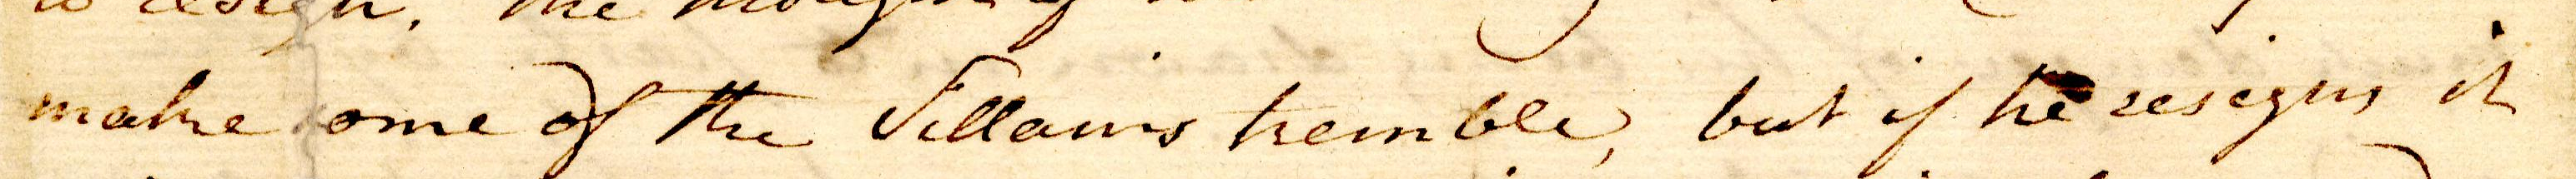make some of the Villains tremble, but if he resigns it
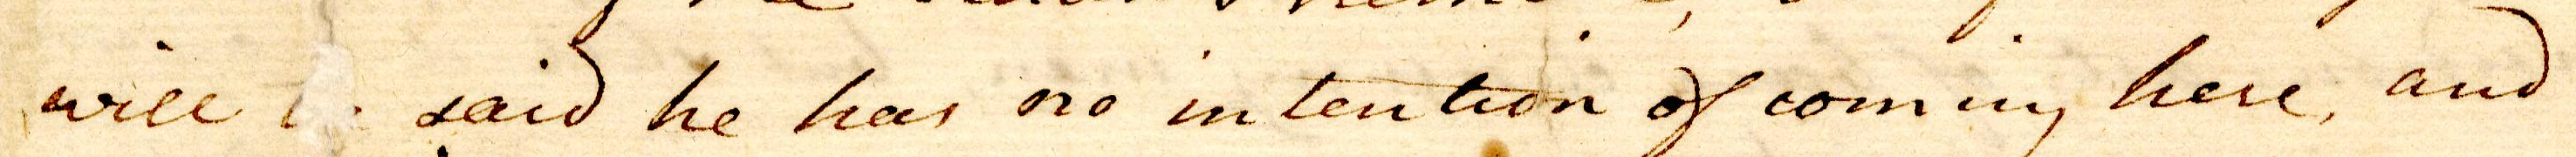will [__] said he has no intention of coming here, and
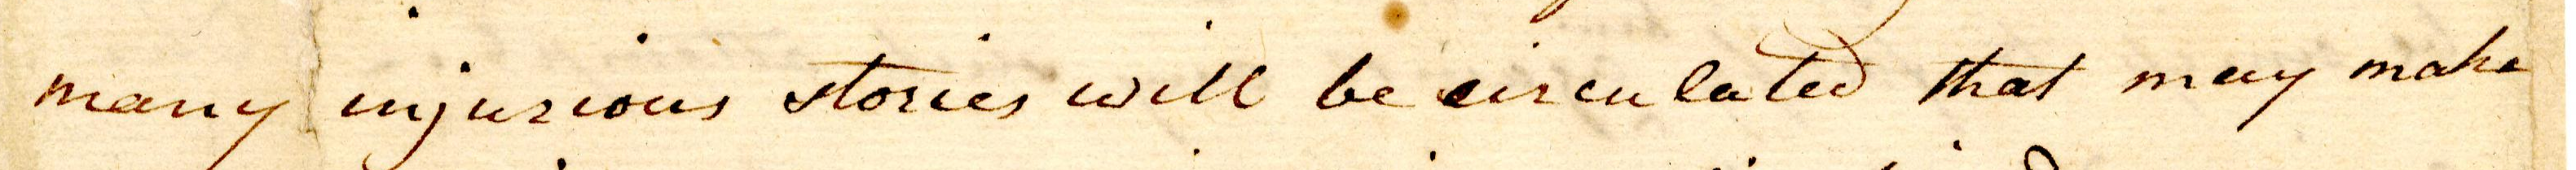many injurious stories will be circulated that may make
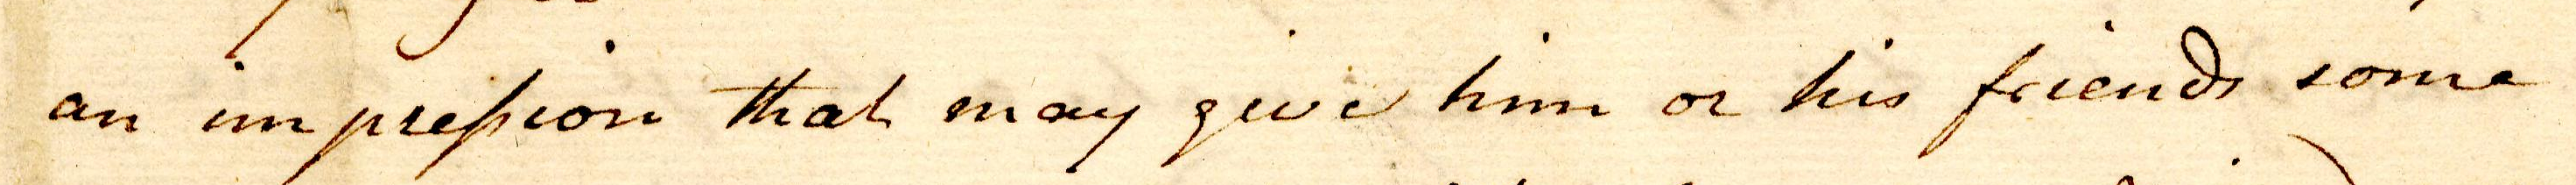an impression that may give him or his friends some
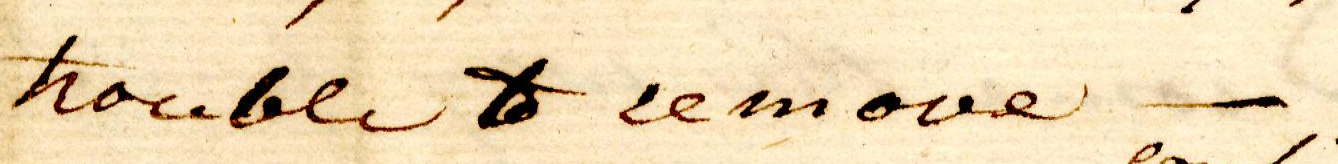trouble to remove-
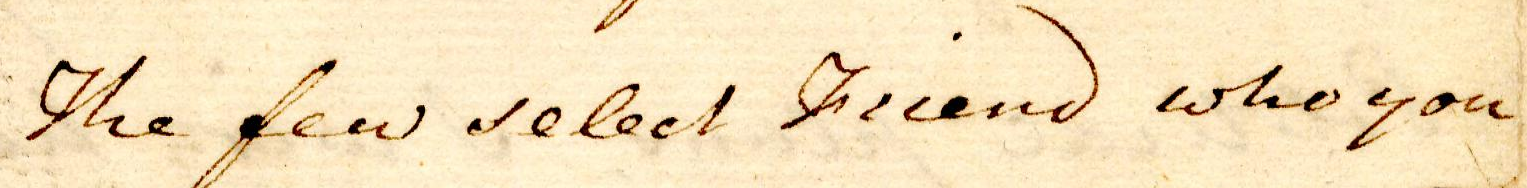The few select Friend who you
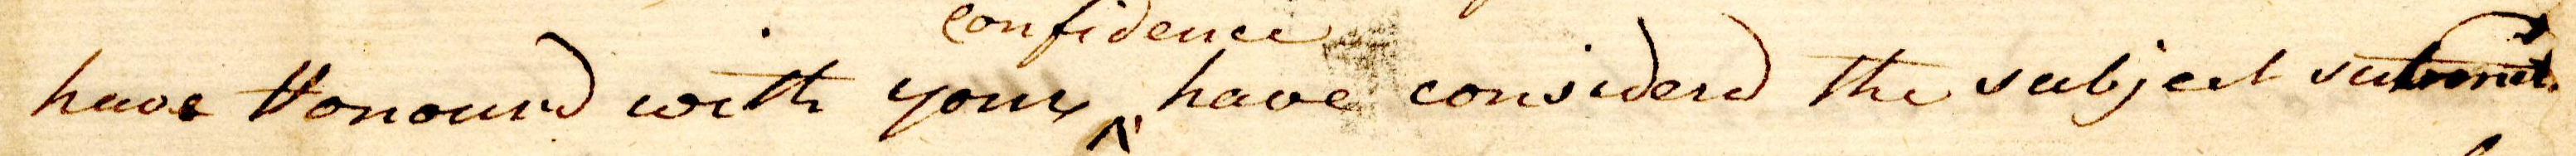have Honourd with your ^ have considered the subject situate-
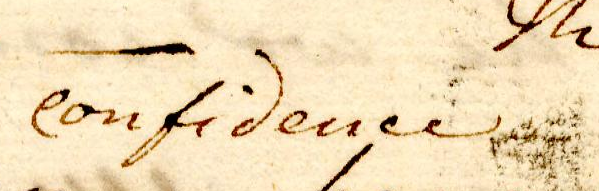confidence
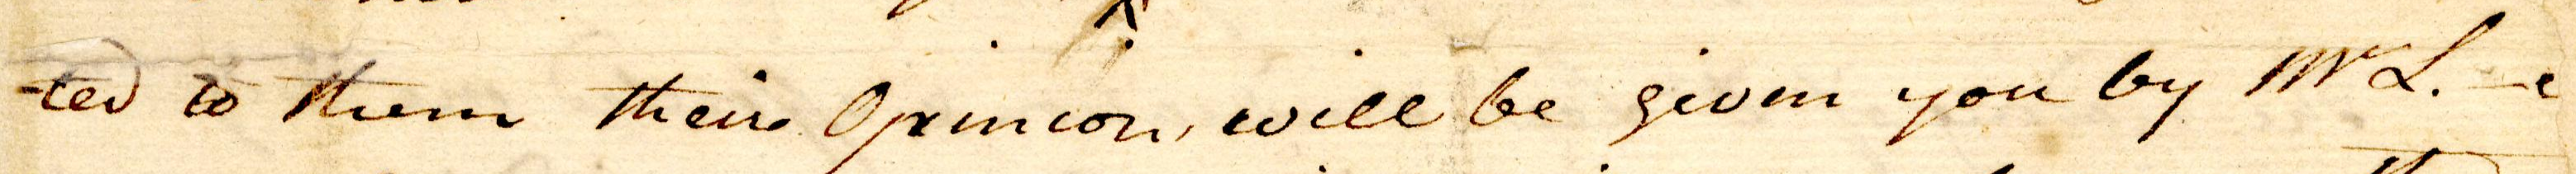-ted to them their Opinion will be given you by M^r Lee
